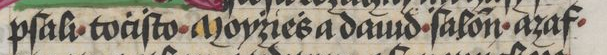pſali.točiẛto.Moyżieš a david.ẛalon.azaf.
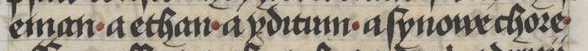eman.a ethan.a yditum.a ſunowe chozeſ.
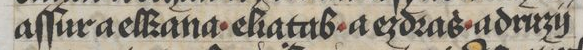aſſur a elkana.eliatab.a ezdraṡ.a druzij
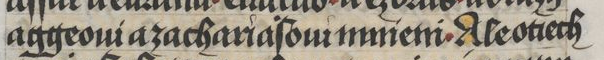aggeovi a zachariaẛow mnieni.Ale otiech
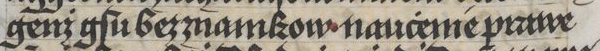genż gſu bez znamkow.nauċeníe prawe¬
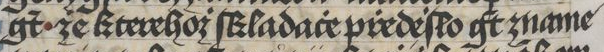ḡt.ze kterehož ſkladaċe předeẛlo ḡt zname¬
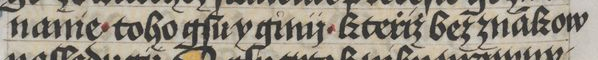nanie.toho gſu y ginij.kteṙíż bez znakow
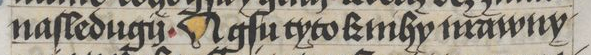naſledugij.A gſu tyto knihy mrawny¬
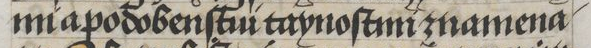mi a podobenſtví taynoſtmi znamena¬
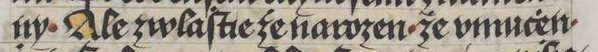ny.Ale zwlaẛtie že narozen.ze umuċen.
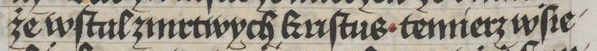że wſtal zmrtwych.kriſtus.temierz wẛie¬
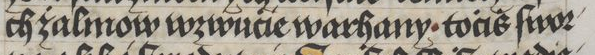ch żalmow wzwuċíe warhany.toċiṡ ſwor¬
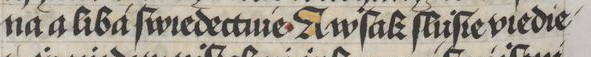na a libá ſwiedectvíe.Awẛak ſluẛie viedie¬
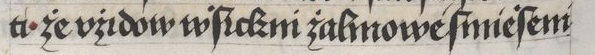ti.že vžidow wẛickni żalmowé ſmieẛeni
